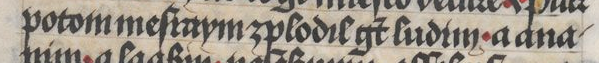potom meſraym zplodil ḡt ludim.a ana¬
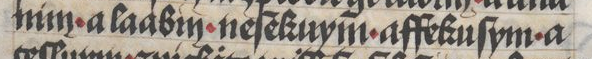nim.a laabin.neſekuym.affeku ſym.a
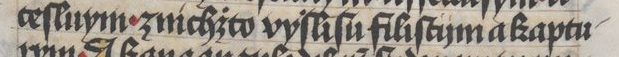teſluym.znichżto vyẛli ſu filiſtijm a kaptu¬
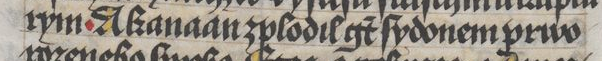rym.A kanaan zplodil ḡt ſydonem prwo¬
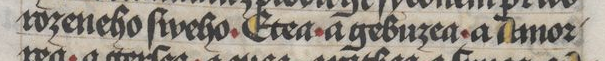rozeneho ſweho.Etea.a gebuzea.a Amor¬
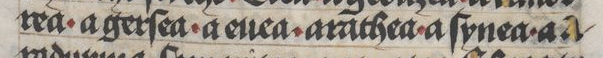rea.a gerſea.a euea.arathea.a ſynea.a A¬
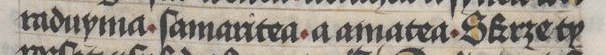raduyma.ſamaritea.a amatea.Skrze ty
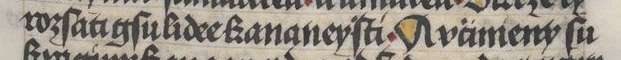rozſati gſu lidee kananeyẛtí.A vċinieny ſu
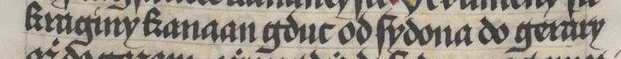kraginy kanaan gduc od ſydona do gerary
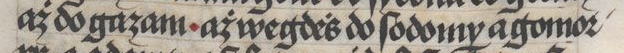aż do gazam.aż wegdeṡ do ſodomy a gomor¬
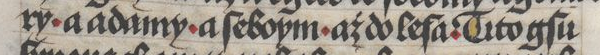ry.a adamy.a ſeboym.aż do leſa.Tito gſu
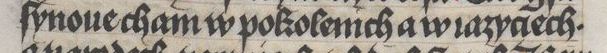ſynoue cham w pokolenich a wiazyciech.
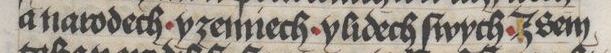a narodech.y zemiech.ylidech ſwych.Zsem
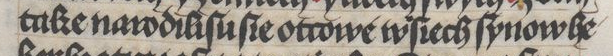take narodiliſu ſie otcowé wẛiech ſynow he¬
